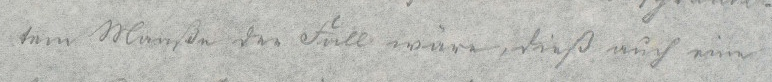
tem Maaße der Fall wäre, dieß auch eine
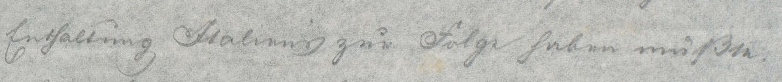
Enthaltung Italien's zur Folge haben müßte.
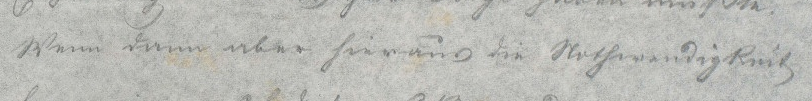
Wenn dann aber hieraus die Nothwendigkeit
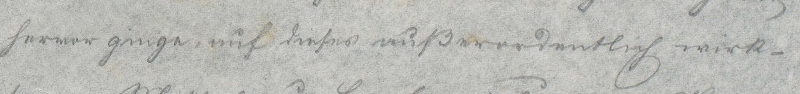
hervor ginge, auf dieses außerordentlich wirk-
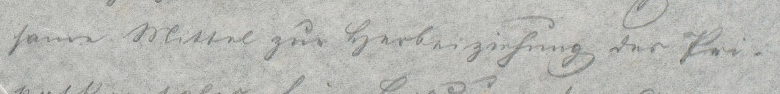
same Mittel zur Herbeiziehung des Pri-
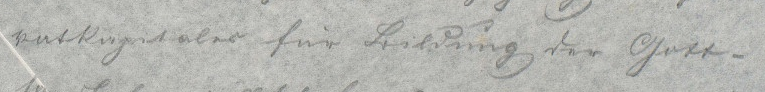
vatkapitales für Bildung der Gott-
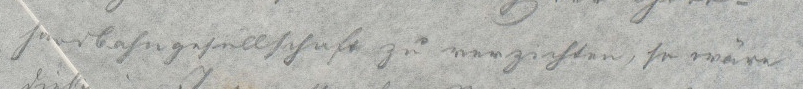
hardbahngesellschaft zu verzichten, so wäre
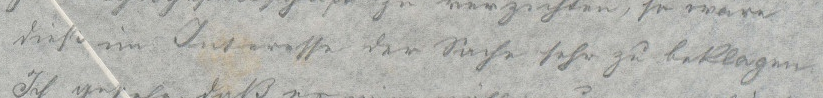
dieß im Interesse der Sache sehr zu beklagen.
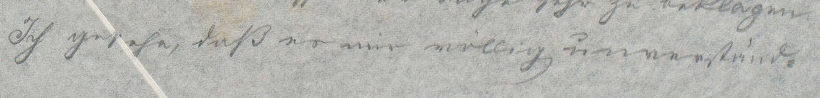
Ich gestehe, daß es mir völlig unverständ-
